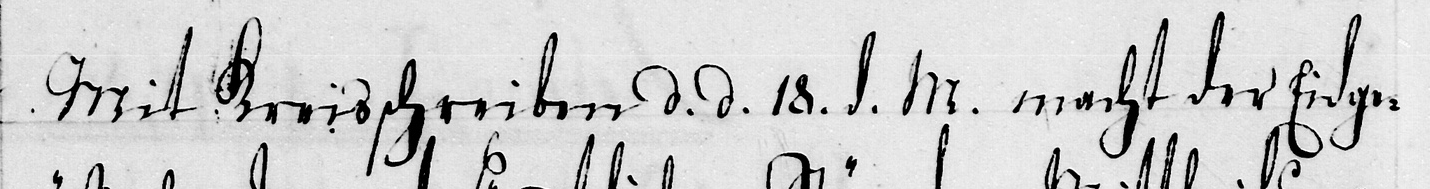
Mit Kreisschreiben d. d. 18. d. M. macht der Eidge¬
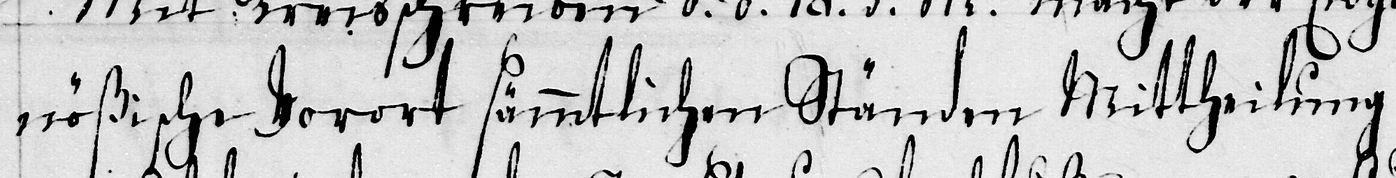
nößische Vorort sämmtlichen Ständen Mittheilung
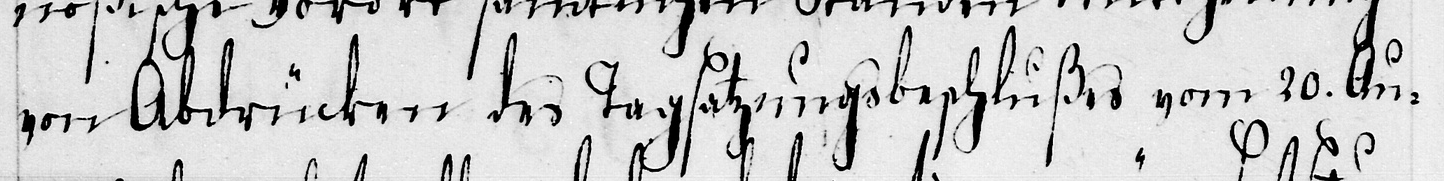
von Abdrücken des Tagsatzungsbeschlußes vom 20. Au¬
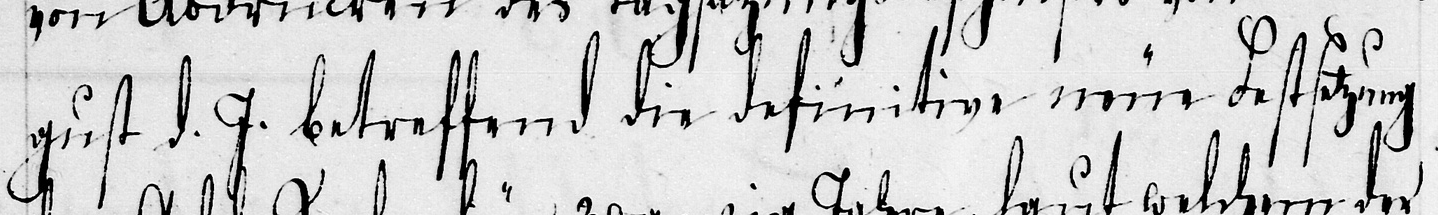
gust d. J. betreffend die definitive neue Festsetzung
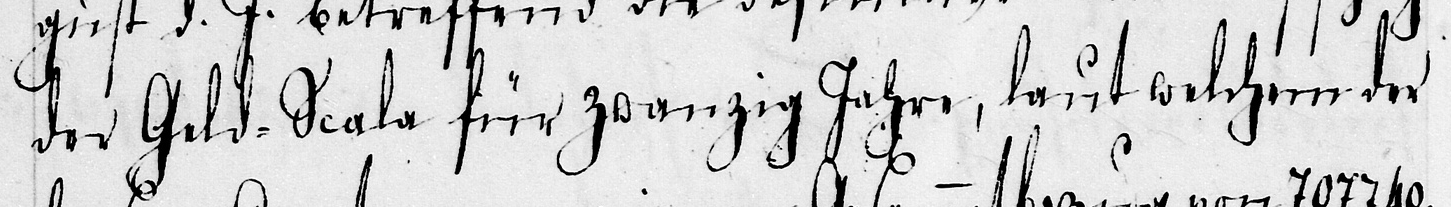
der Geld-Scala für zwanzig Jahre, laut welchem der
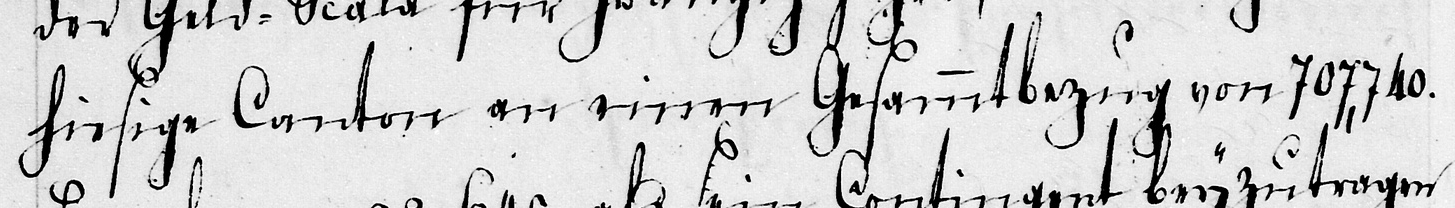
hiesige Canton an einen Gesammtbezug von 7070,740.
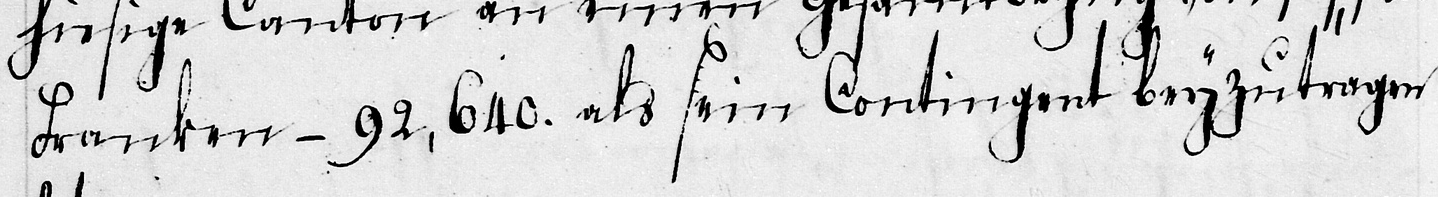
Franken – 92, 640. als sein Contingent beyzutragen
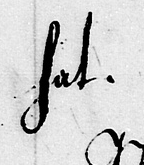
hat.
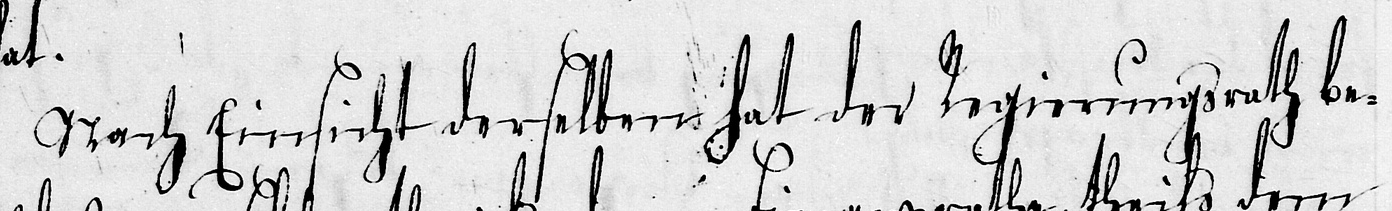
Nach Einsicht derselben hat der Regierungsrath be¬
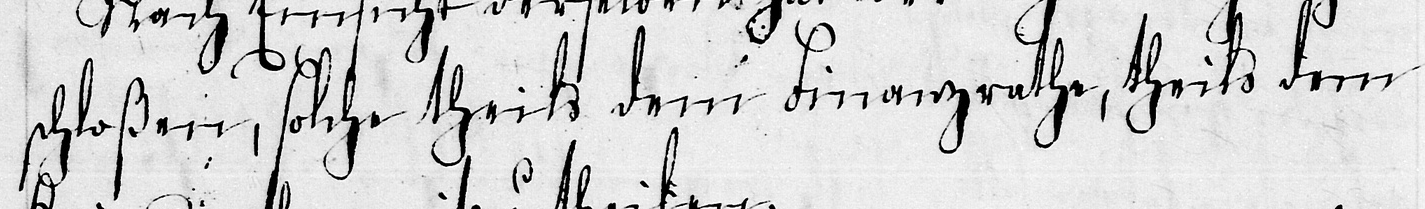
schloßen, solche theils dem Finanzrathe, theils dem
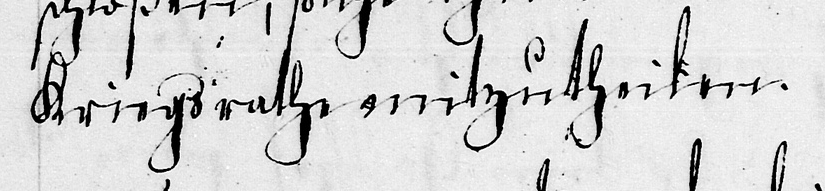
Kriegsrathe mitzutheilen.
